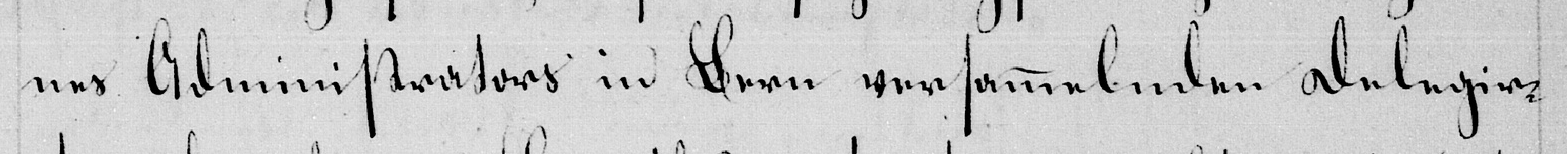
nes Administrators in Bern versammelnden Delegir¬
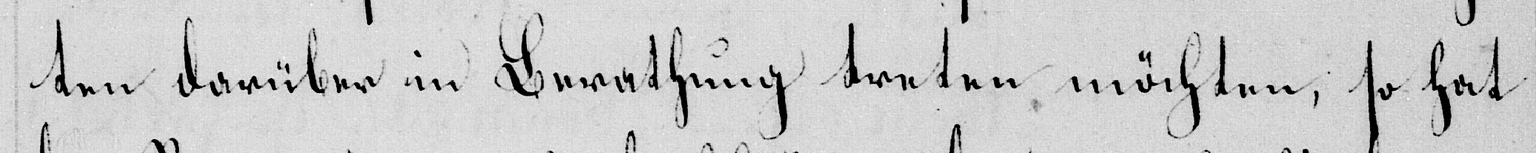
ten darüber in Berathung treten möchten, so hat
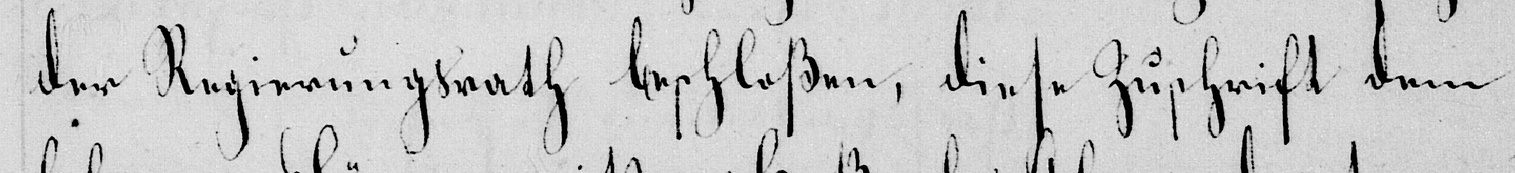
der Regierungsrath beschloßen, diese Zuschrift dem
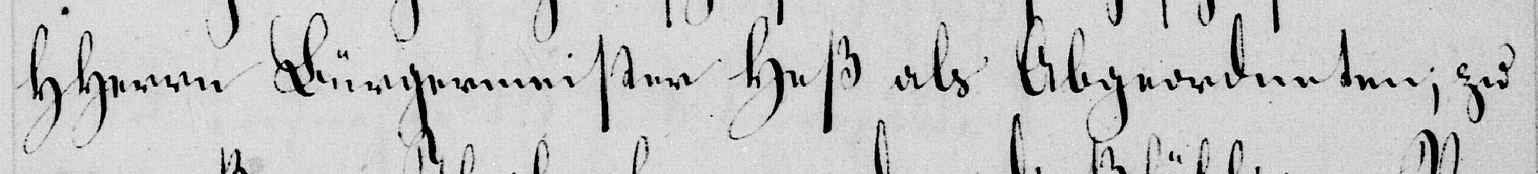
HHerrn Bürgermeister Heß als Abgeordneten, zu
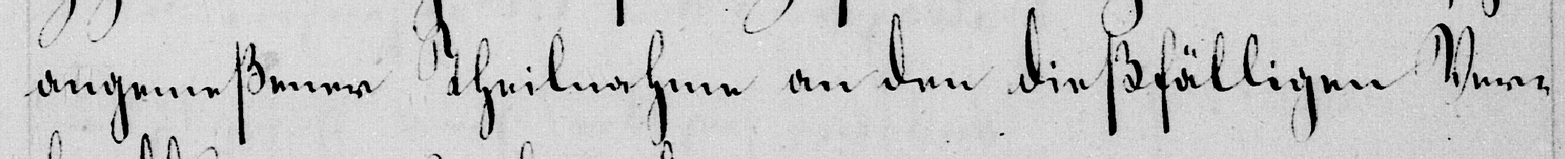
angemeßener Theilnahme an den dießfälligen Ver¬
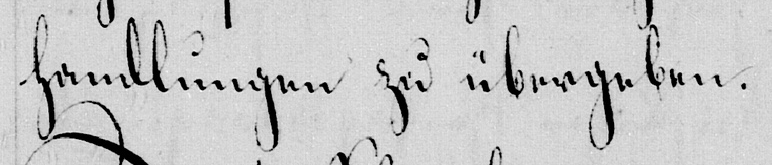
handlungen zu übergeben.
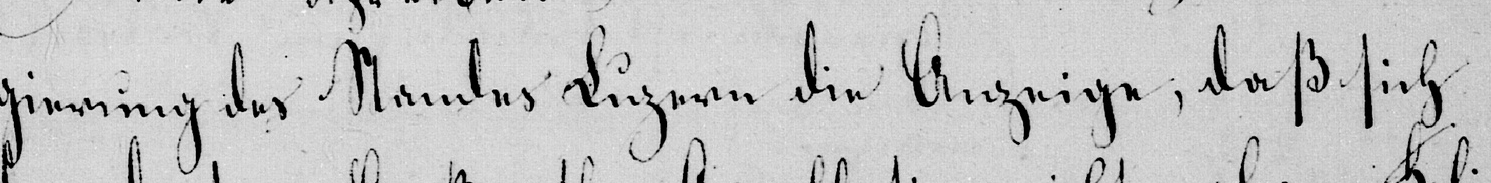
ierung des Standes Luzern die Anzeige, daß sich
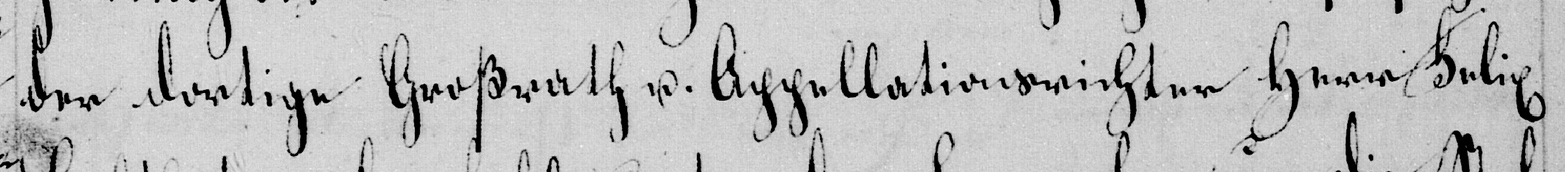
der dortige Großrath u. Appellationsrichter Herr Felix
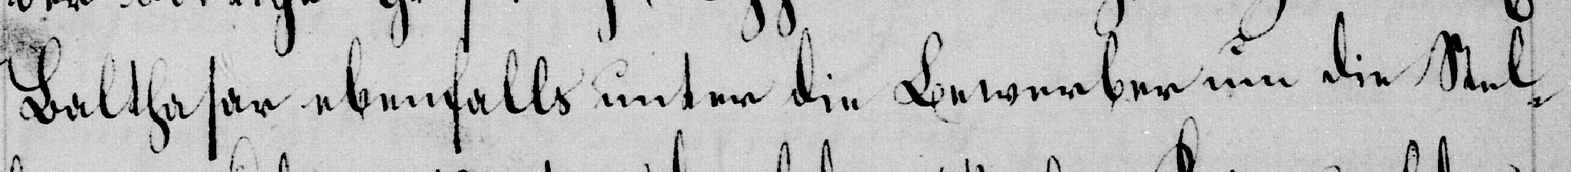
Balthasar ebenfalls unter die Bewerber um die Stel¬
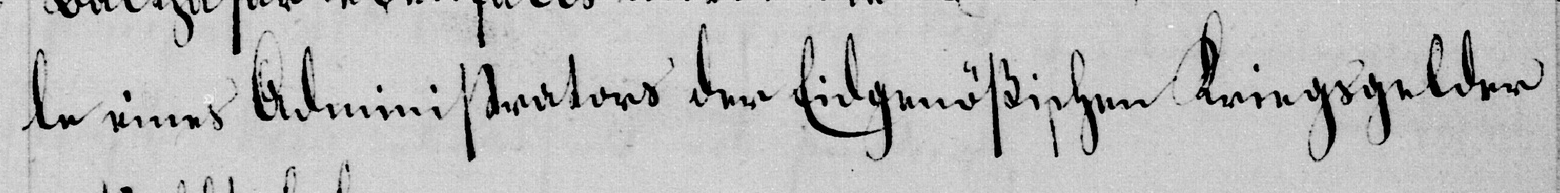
le eines Administrators der Eidgenößischen Kriegsgelder
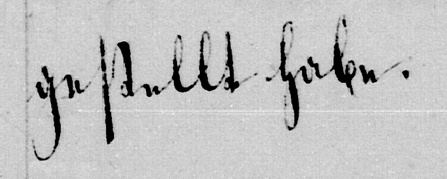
gestellt habe.
